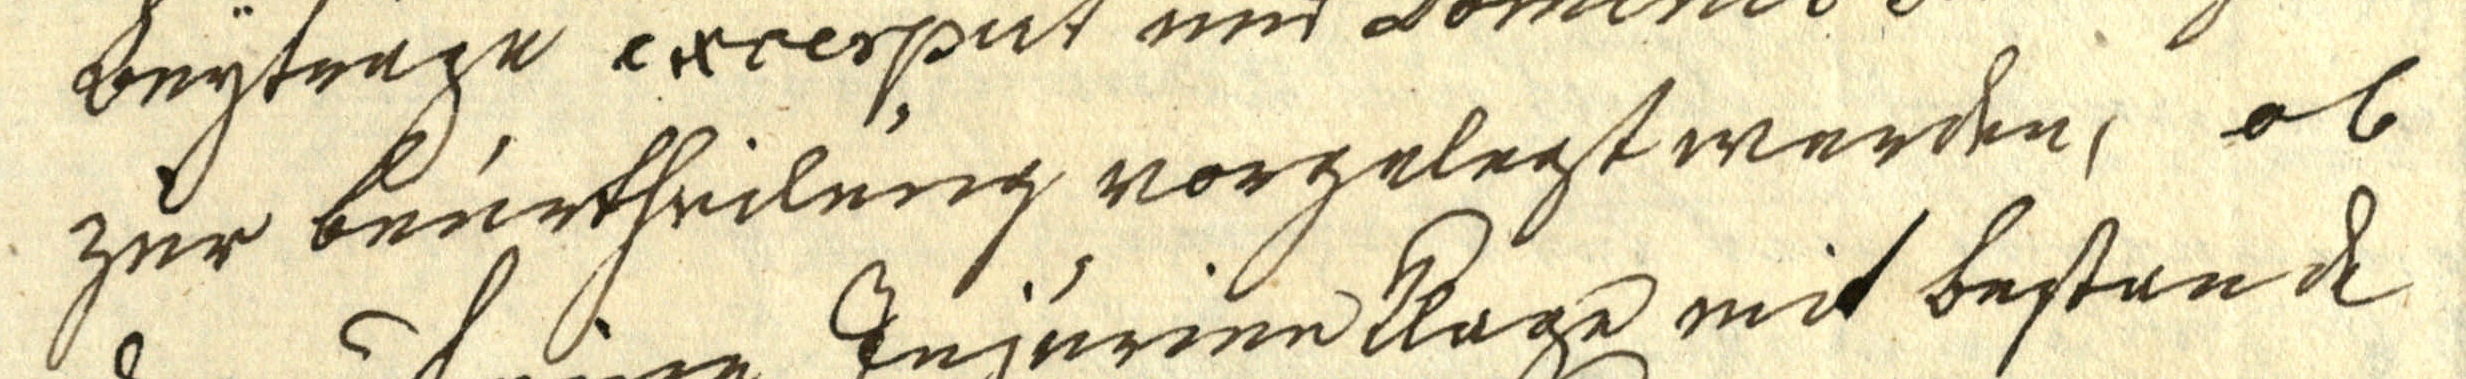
zur Beurtheilung vorgelegt werden, ob
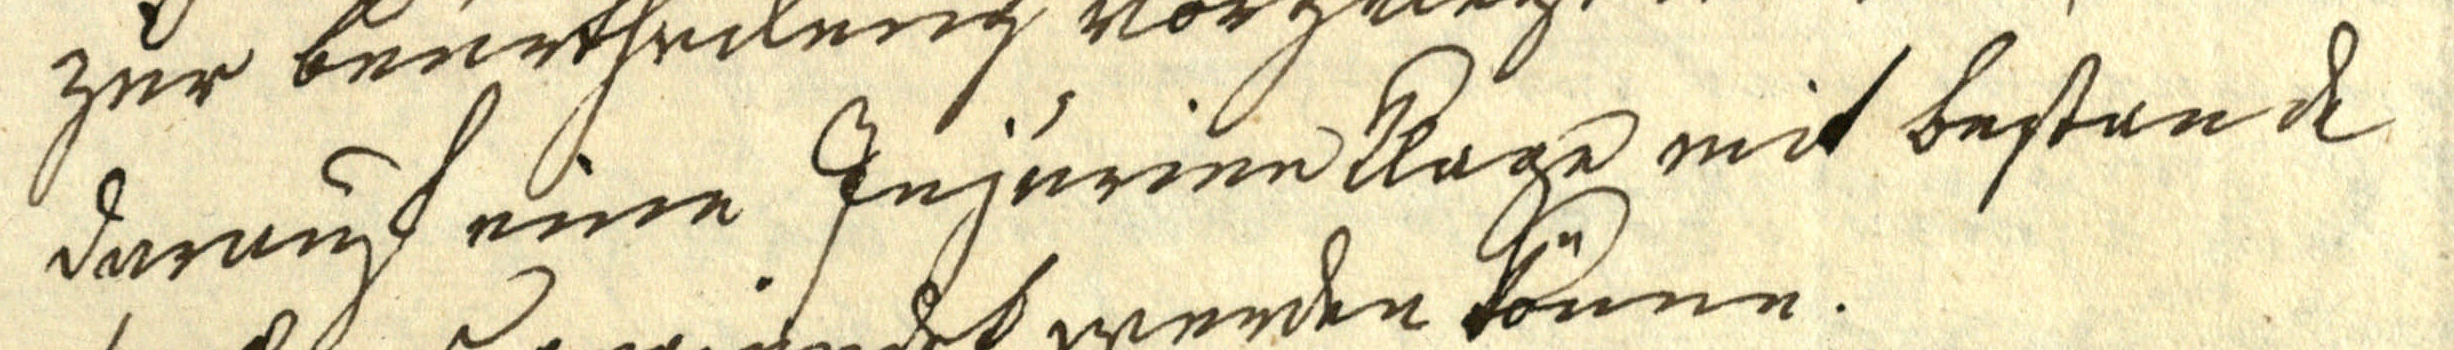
darauf eine Injurien Klage mit Bestande
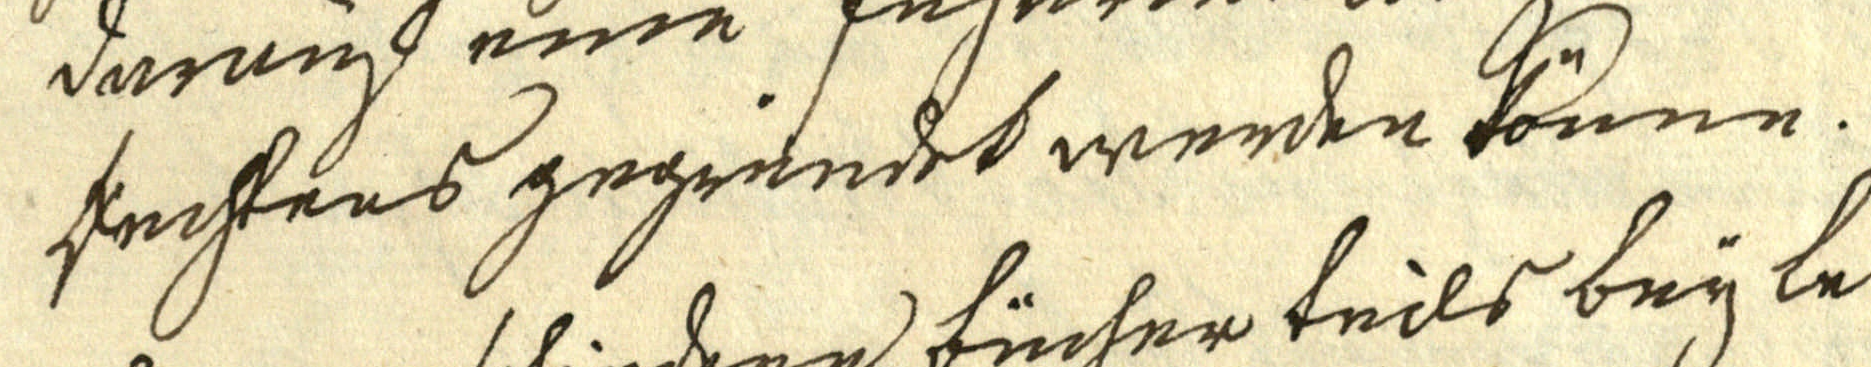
Rechtens gegründet werden könne.
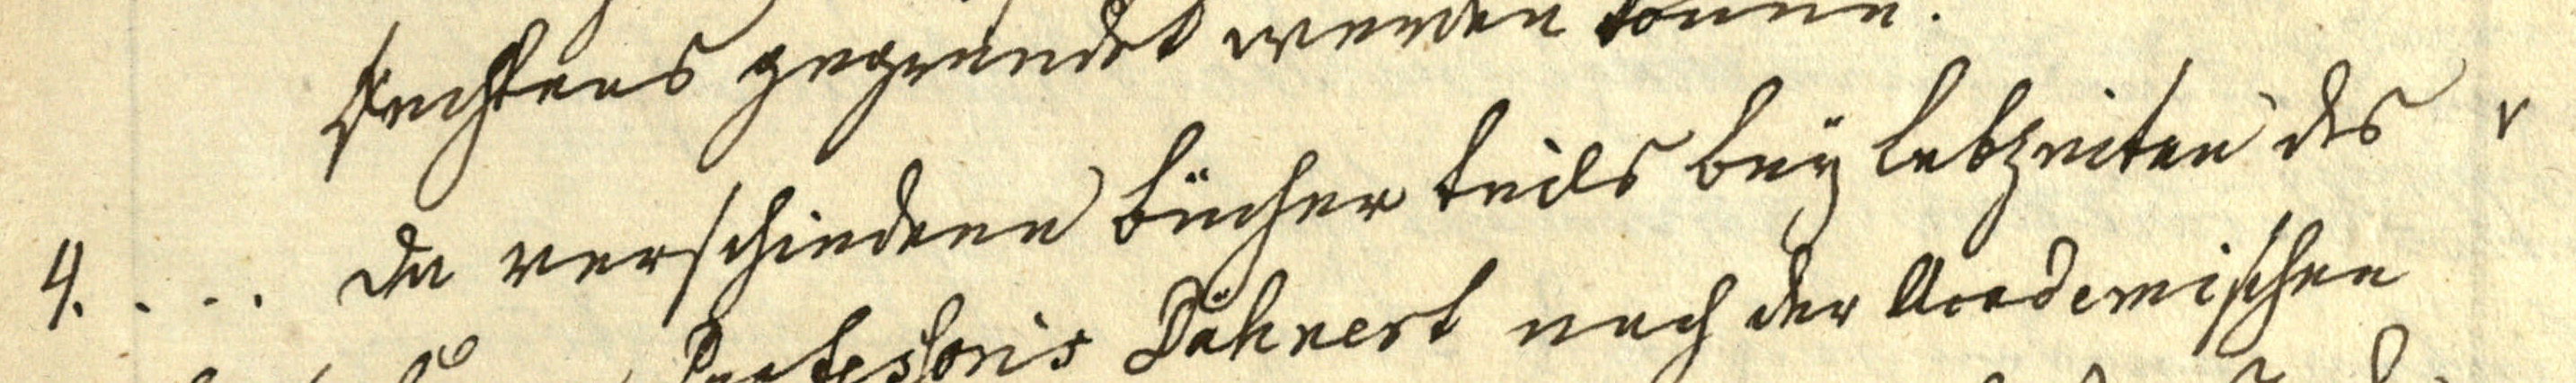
4. Da verschiedene Bücher teils beÿ Lebziten des
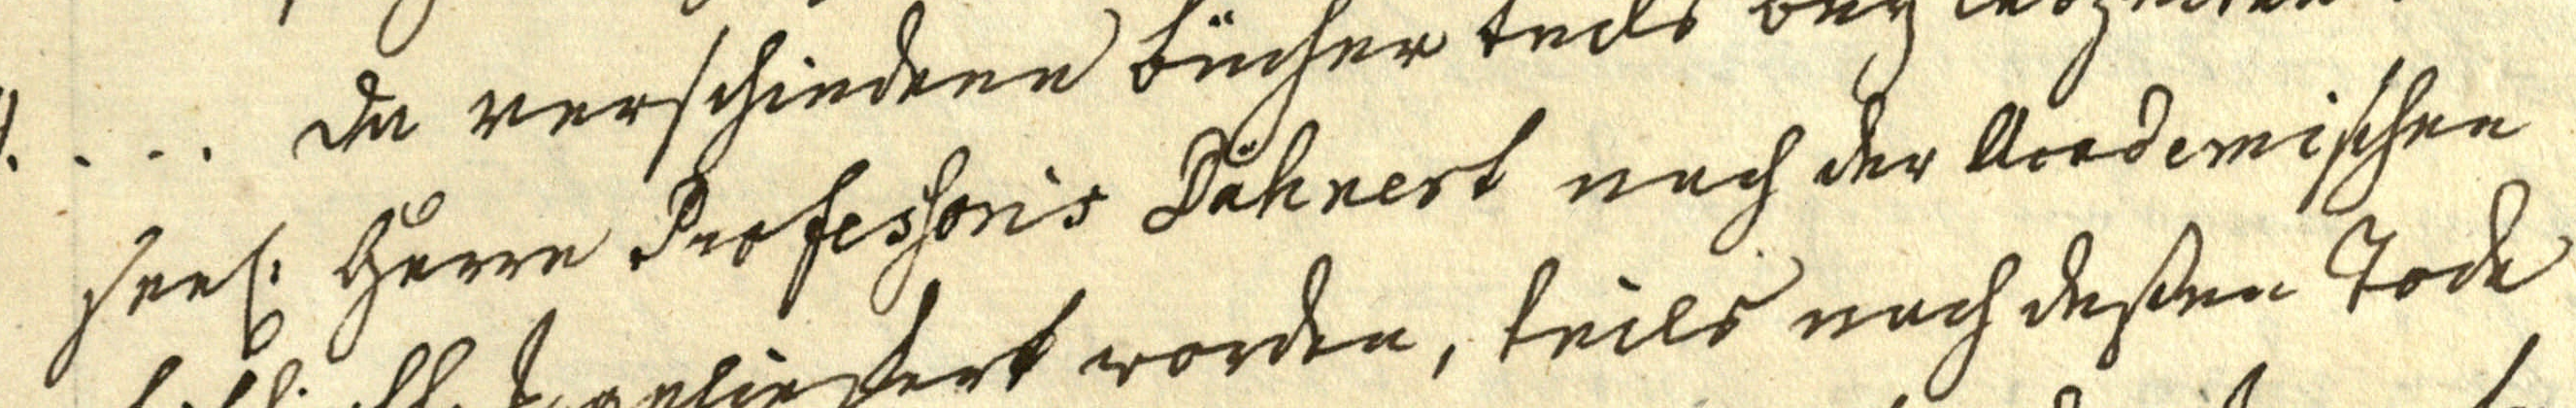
seel. Herrn Professoris Dähnert nach der Academischen
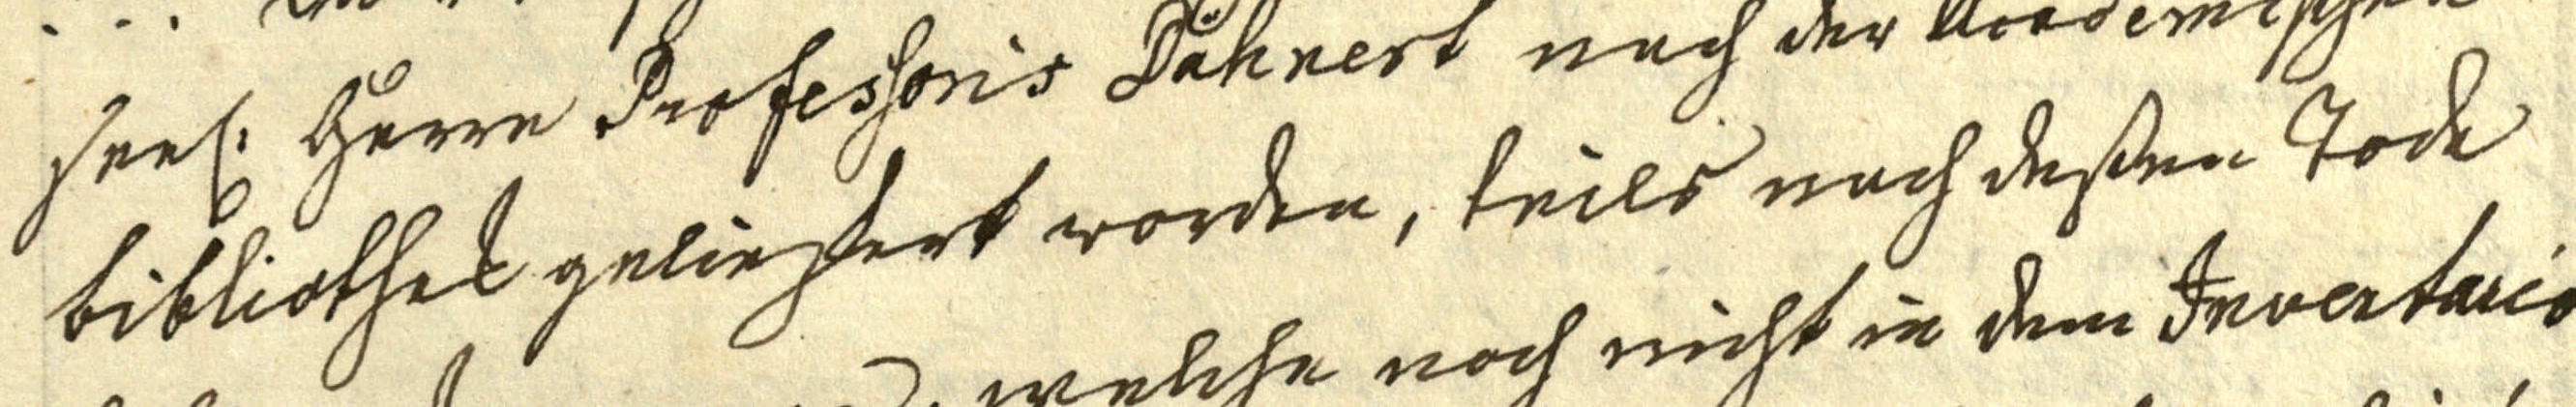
Bibliothek geliefert worden, teils nach deßen Tode
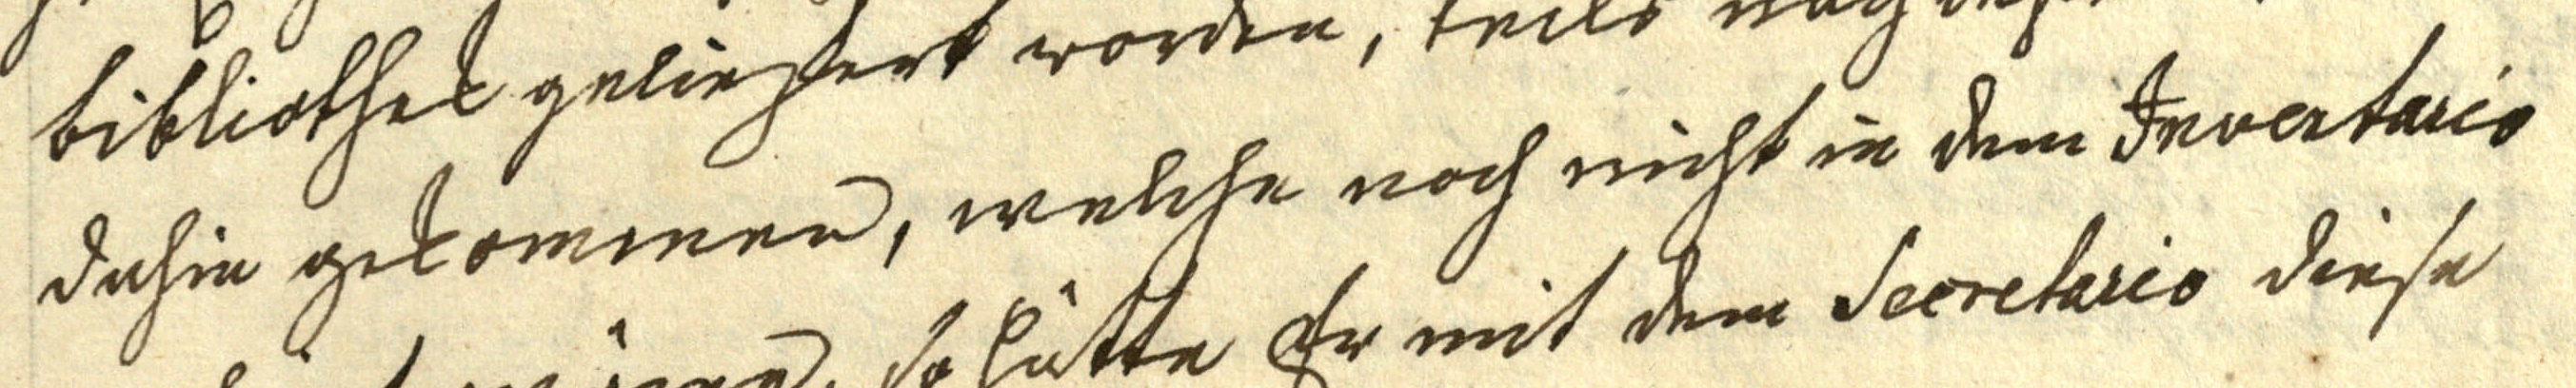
dahin gekommen, welche noch nicht in dem Inventario
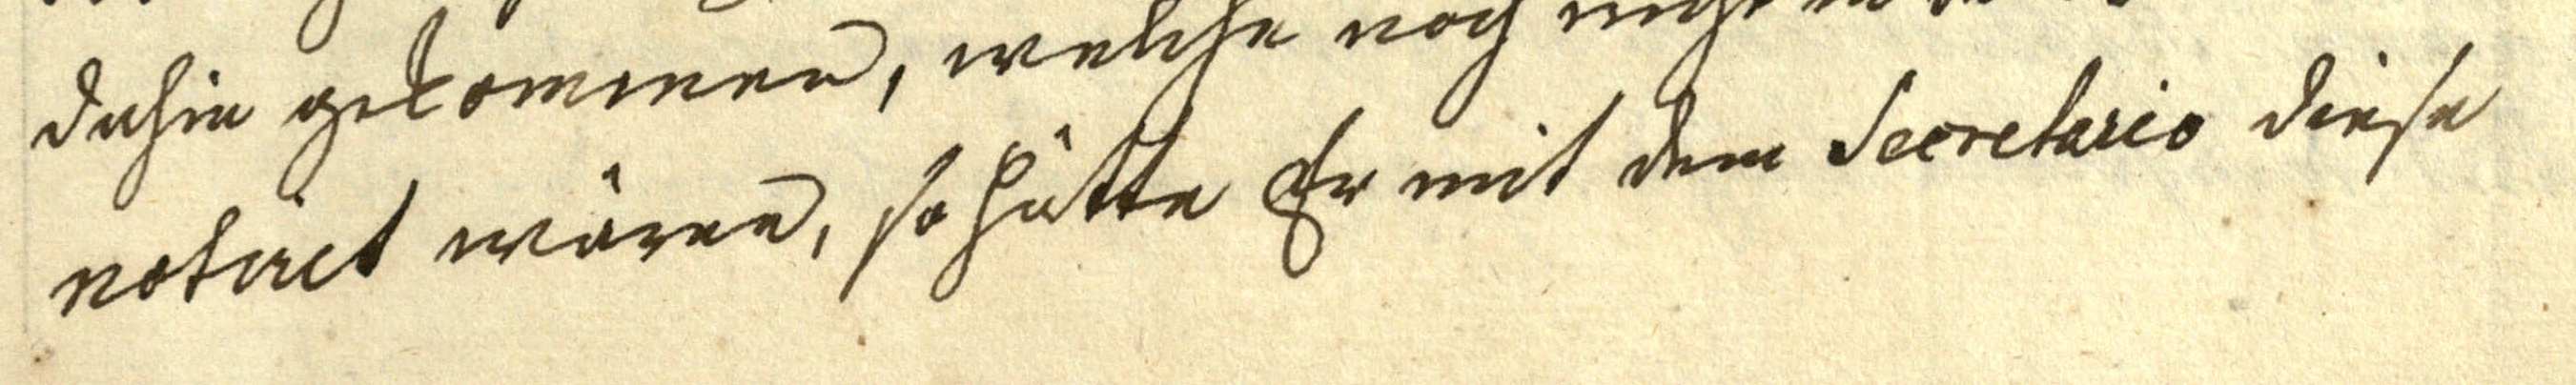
notiret wären, so hätte Er mit dem Secretario diese
